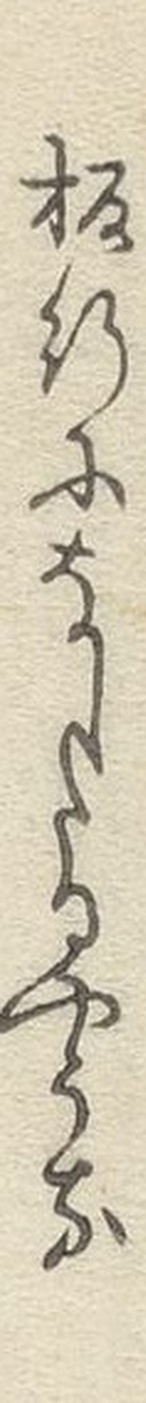板行になしたるやうな
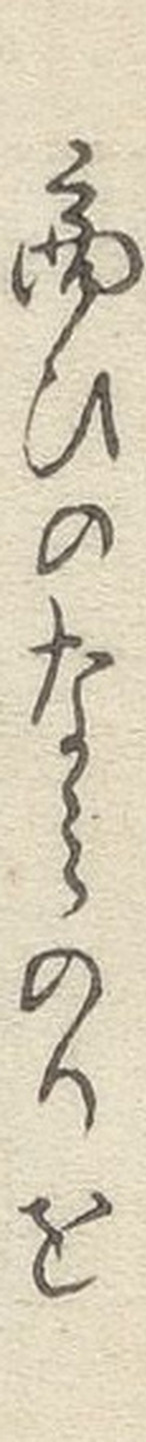商ひのなみのりを
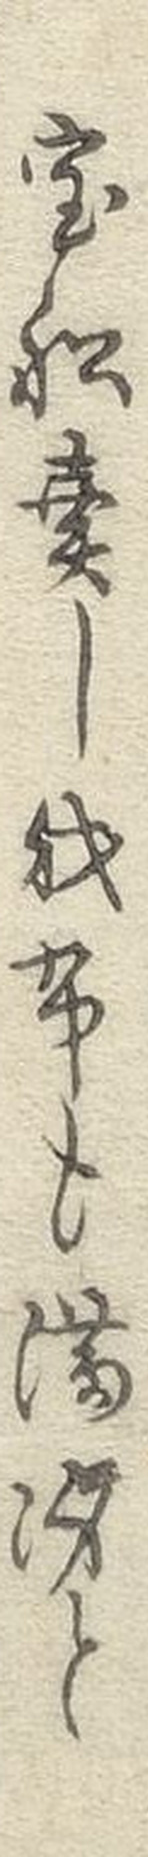宝船売し財布も滿汐と
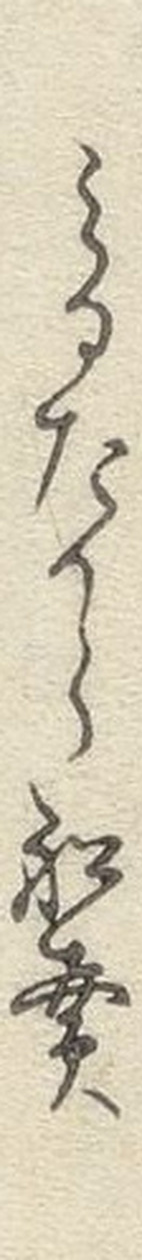みるたから船売
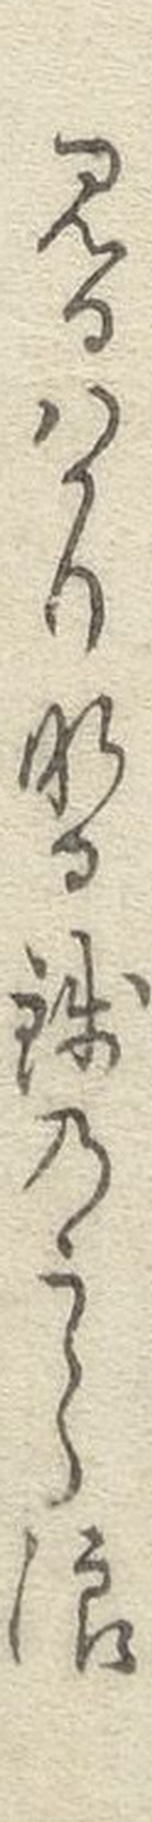見るはかりなる銭のうら浪
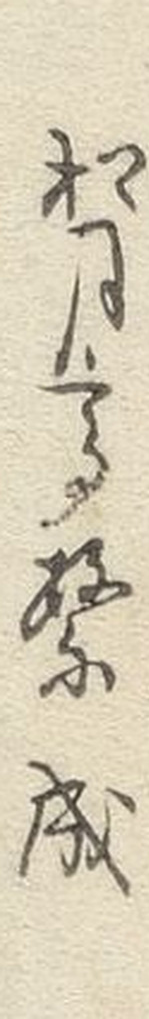松月亭繁成
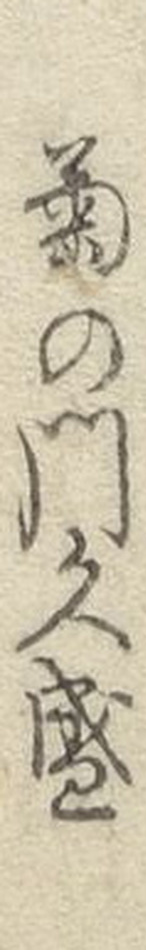菊の門久盛
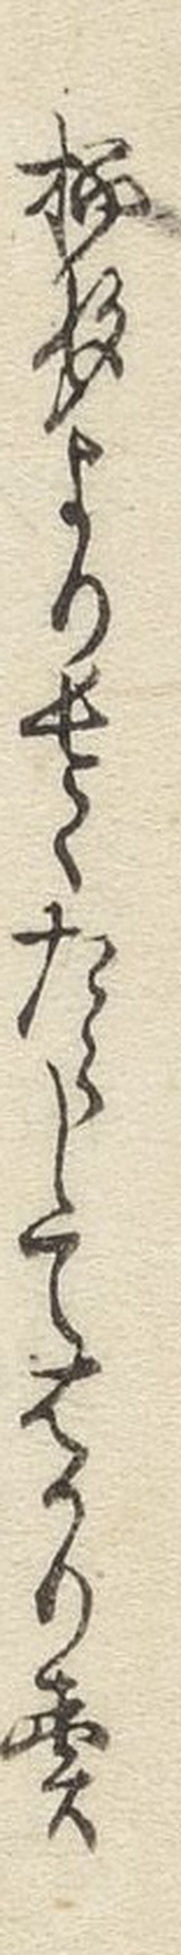柄杓より長くたらしてはかり売
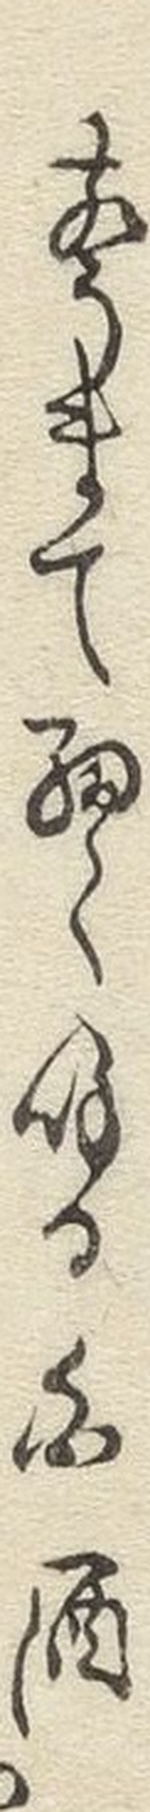声まて細く呼る白酒
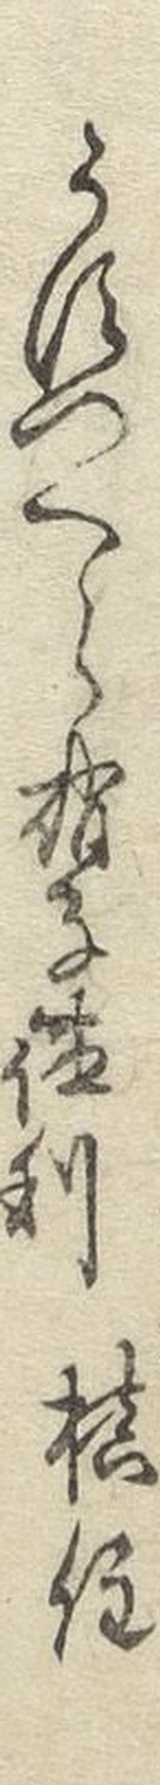うすつへら硝子徳利槙住
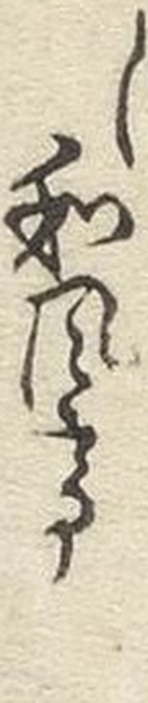和風亭
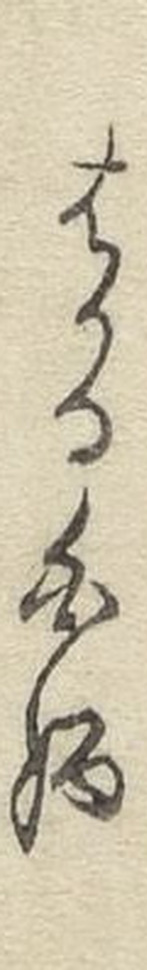はかる白酒
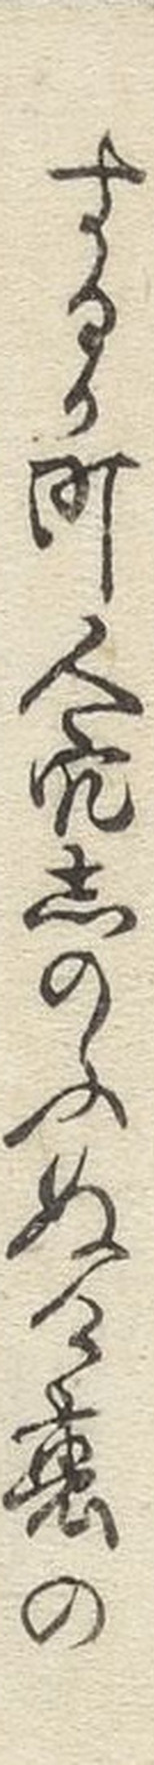するか町人穴しのふぬけ裏の
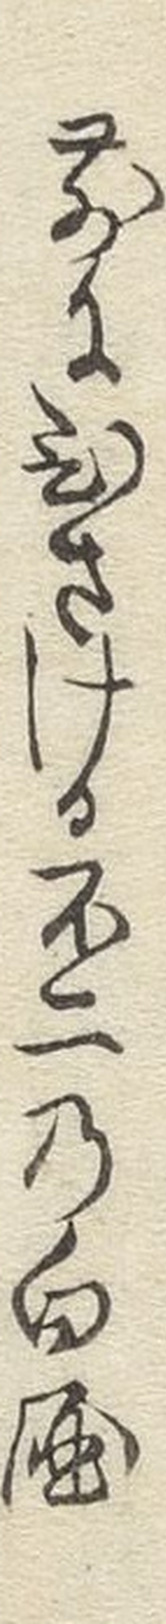前にひさける不二の白酒
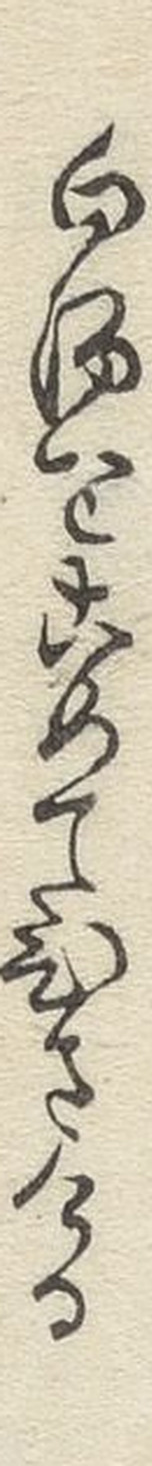白酒をこめてひさける
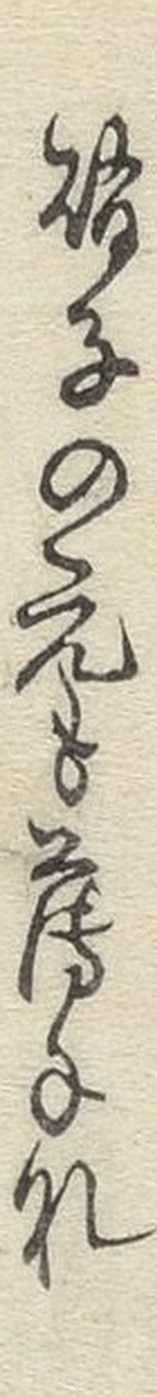硝子の元も薄手な
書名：Picture Album of People with Kyōka (Light Verse) (Kyōka shiki jinbutsu 狂歌四季人物)
